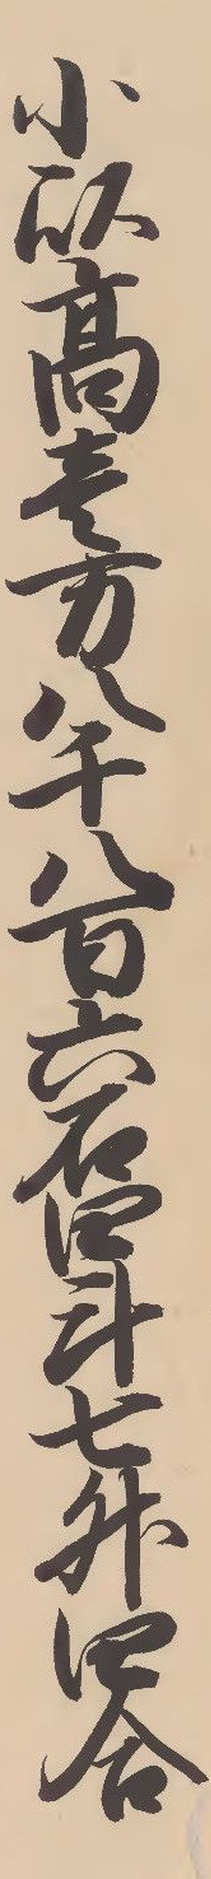小以高壱万八千八百六石四斗七升四合

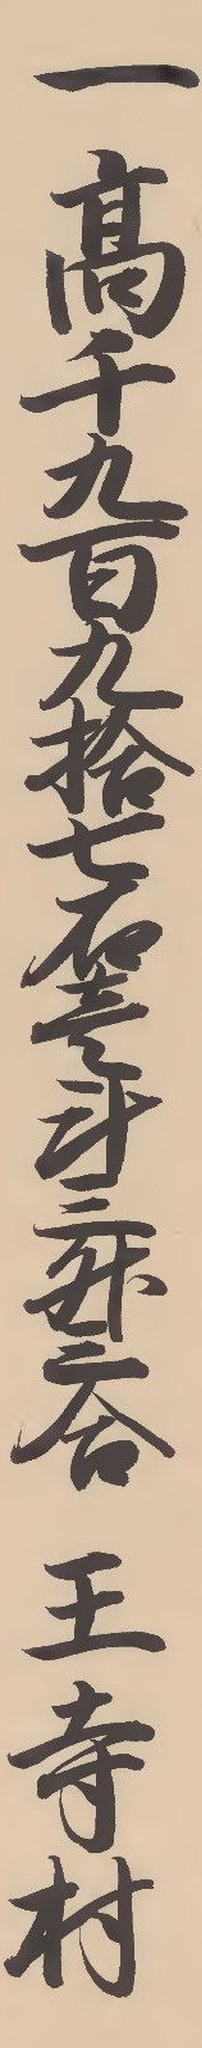一高千九百九拾七石壱斗三升三合王寺村
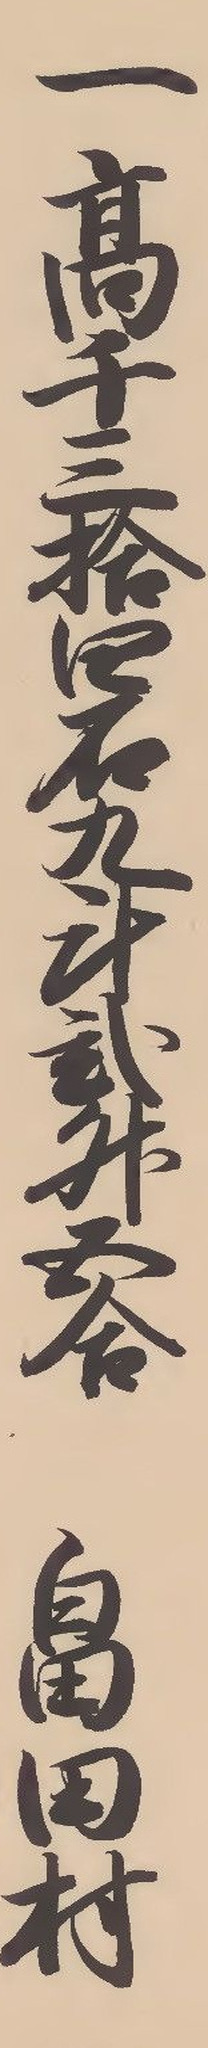一高千三拾四石九斗弐升五合畠田村
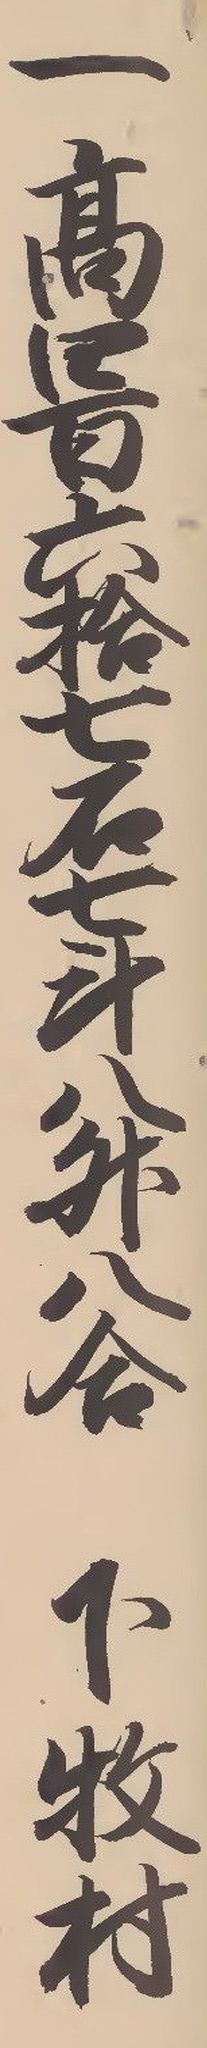一高四百六拾七石七斗八升八合下牧村
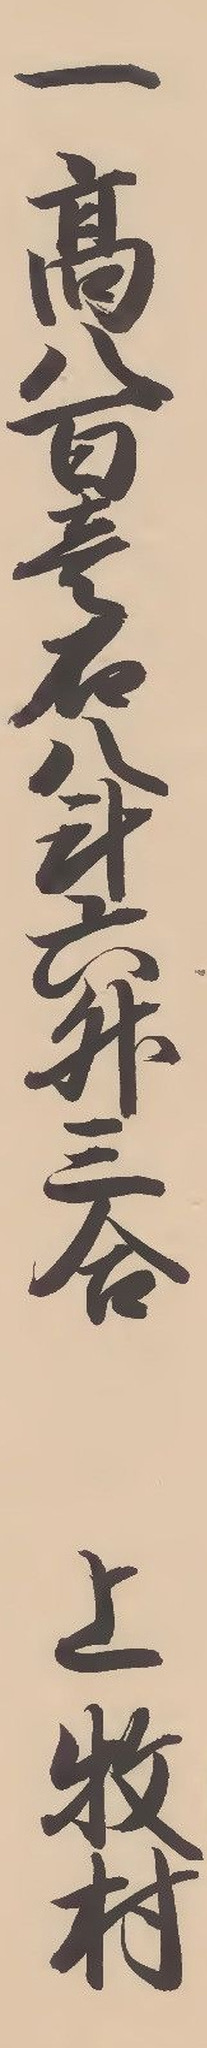一高八百壱石八斗六升三合上牧村
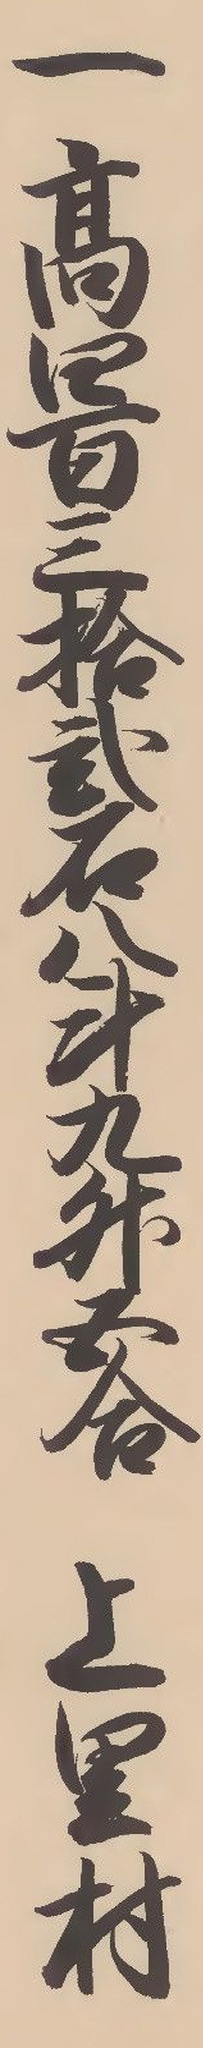一高四百三拾弐石八斗九升五合上里村

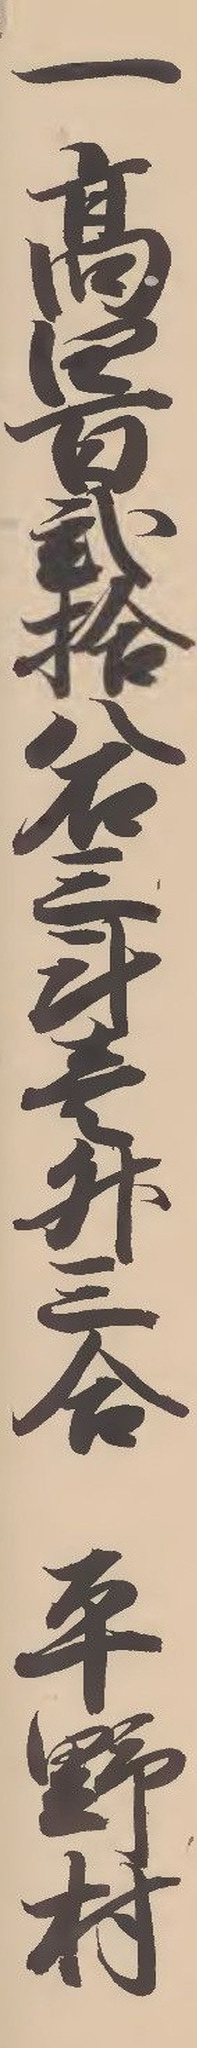一高四百弐拾八石三斗壱升三合平野村
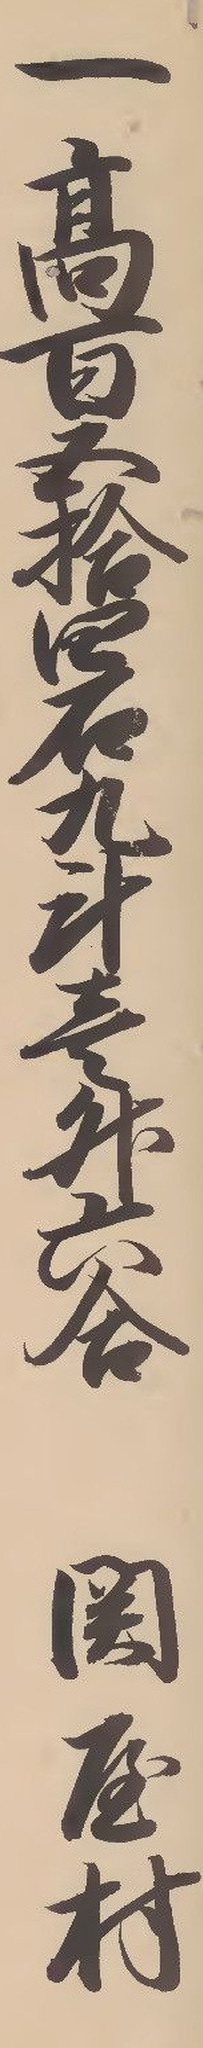一高百五拾四石九斗壱升六合関屋村
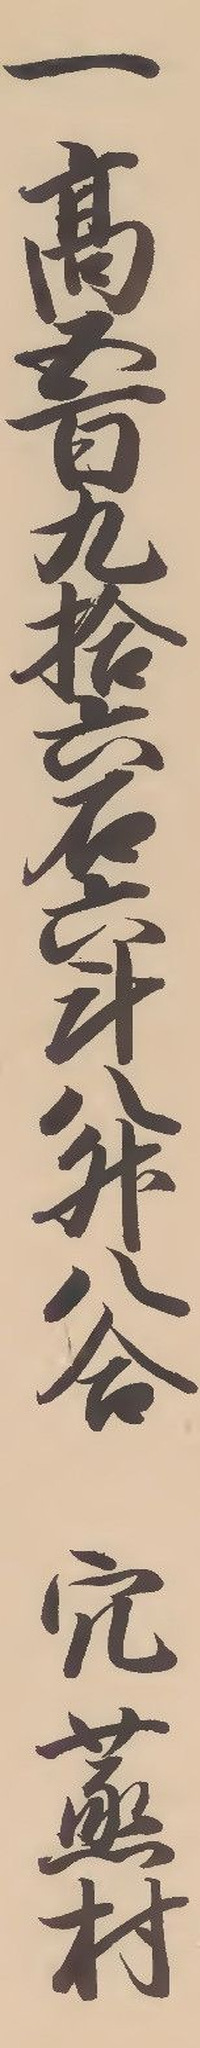一高五百九拾六石六斗八升八合穴蒸村

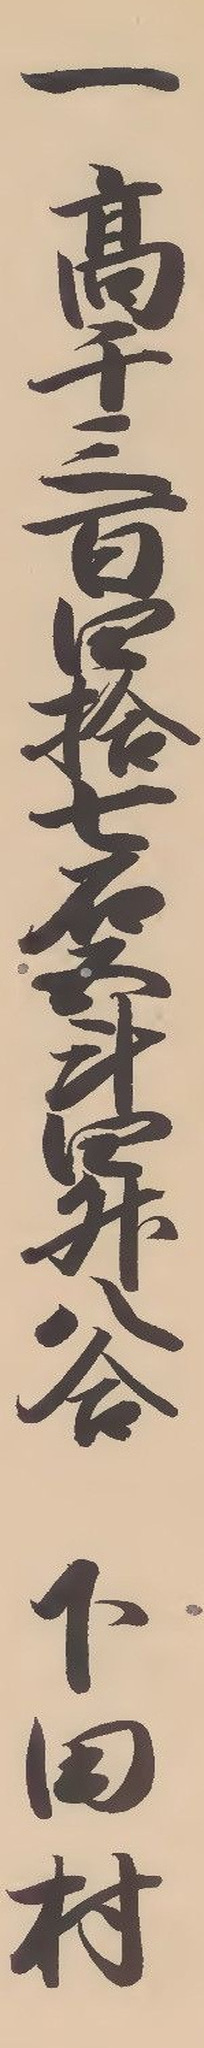一高千三百四拾七石五斗四升八合下田村
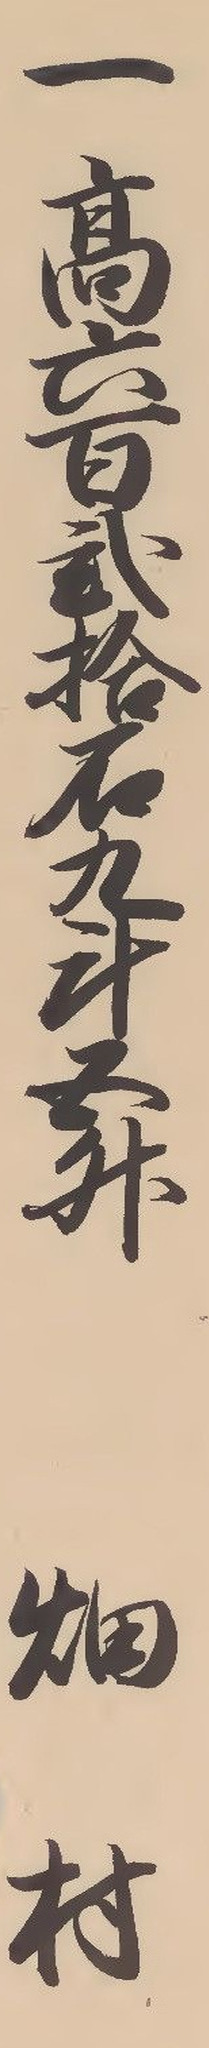一高六百弐拾石九斗五升畑村
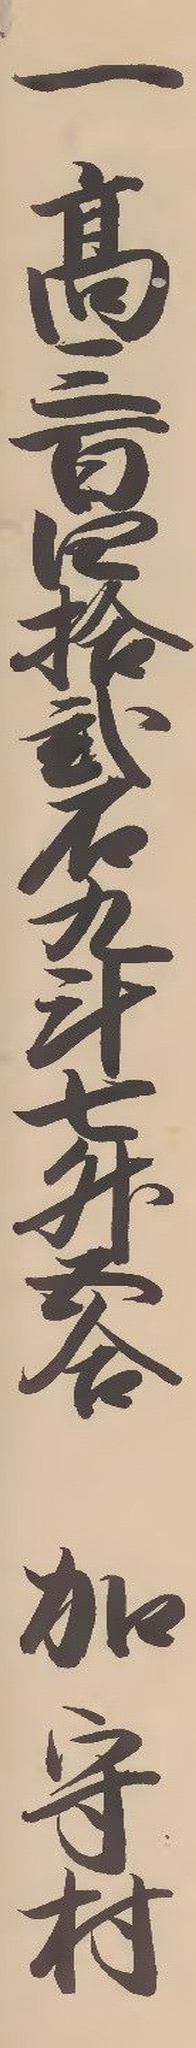一高三百四拾弐石九斗七升五合加守村
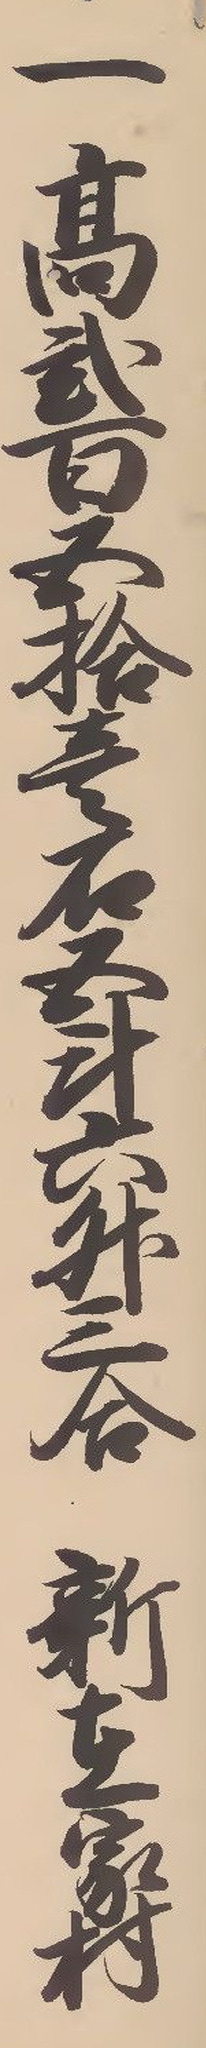一高弐百五拾壱石五斗六升三合新在家村
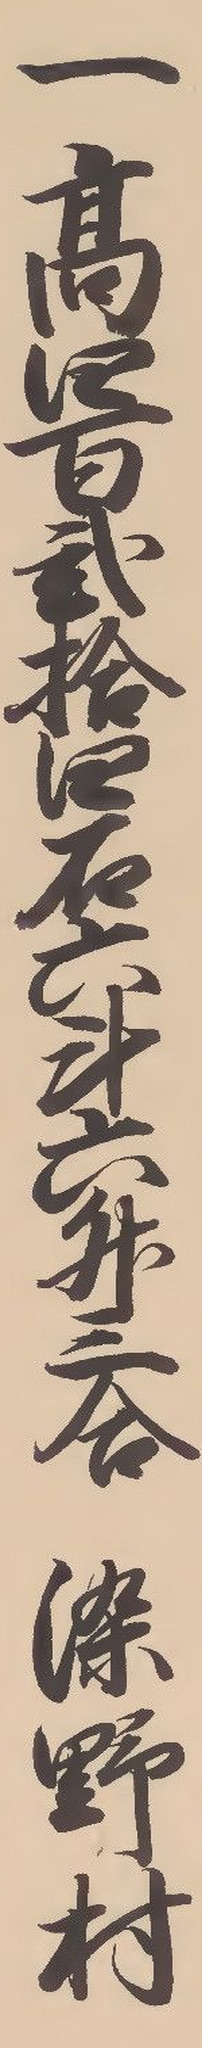一高四百弐拾四石六斗六升三合染野村
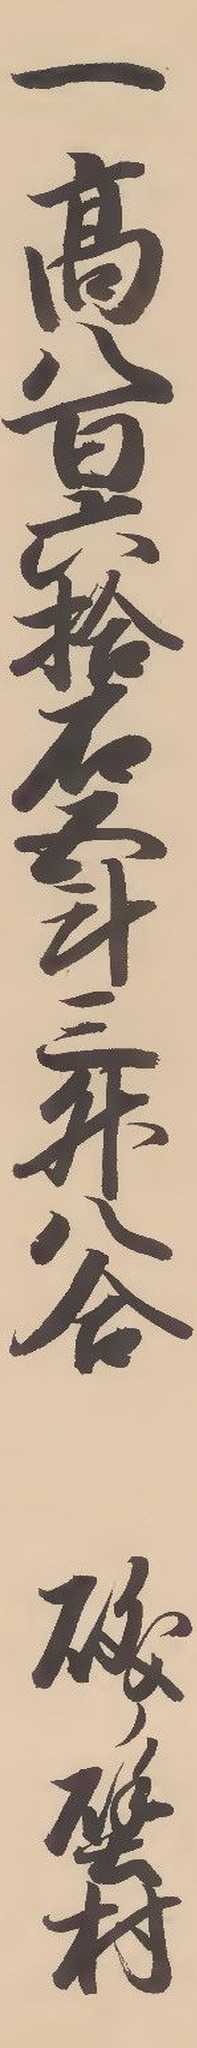一高八百六拾石五斗三升八合磯ノ壁村
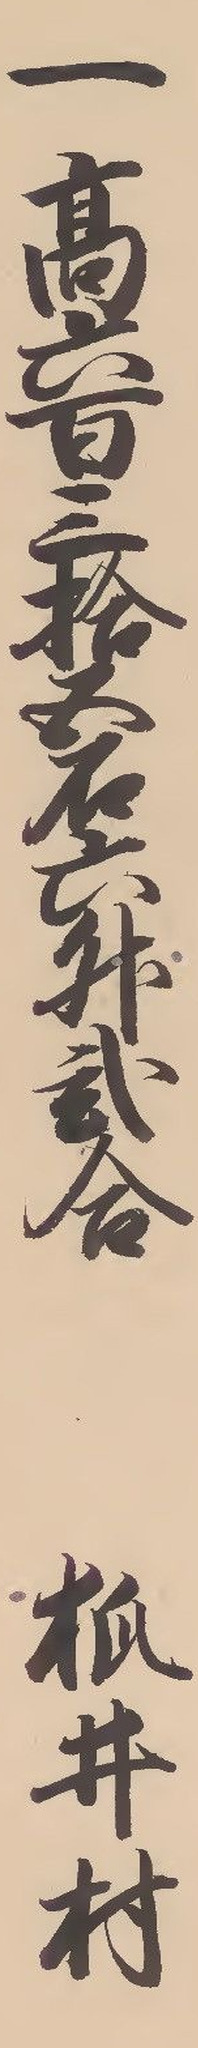一高六百三拾五石六升弐合狐井村
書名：大和国郷帳
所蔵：国立公文書館 National Archives of Japan
